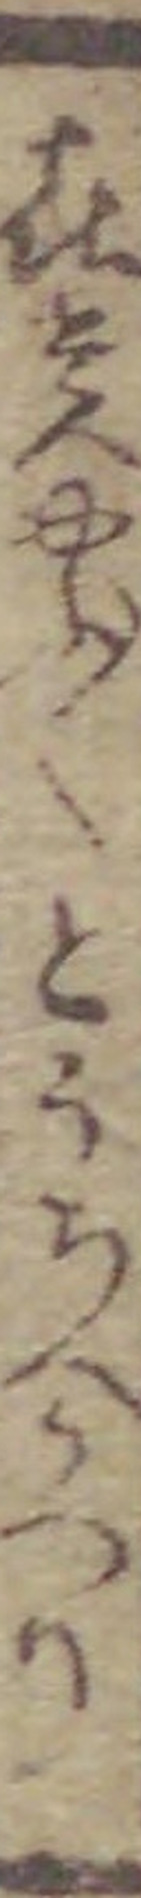喜兵へやふ〳〵とうちへかへり
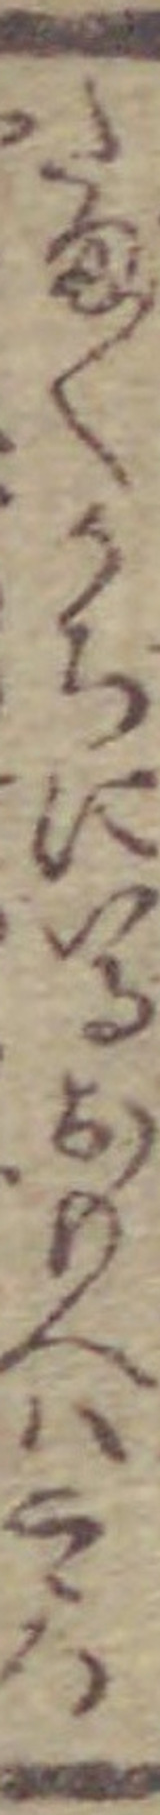たま〳〵うちにいるおもへはこゝろ
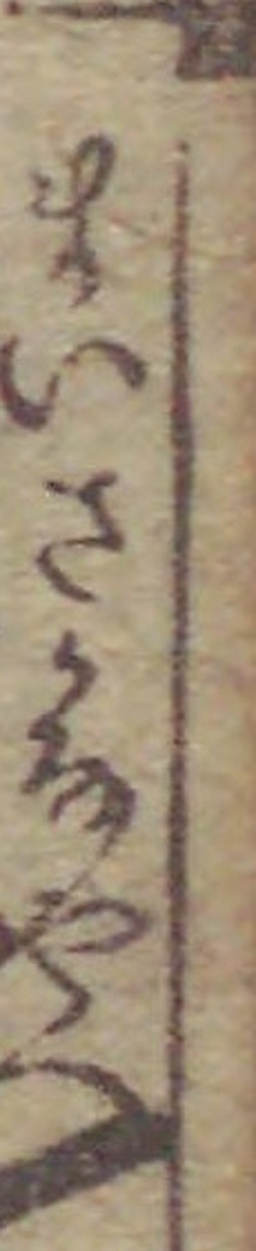まいさかなやへ
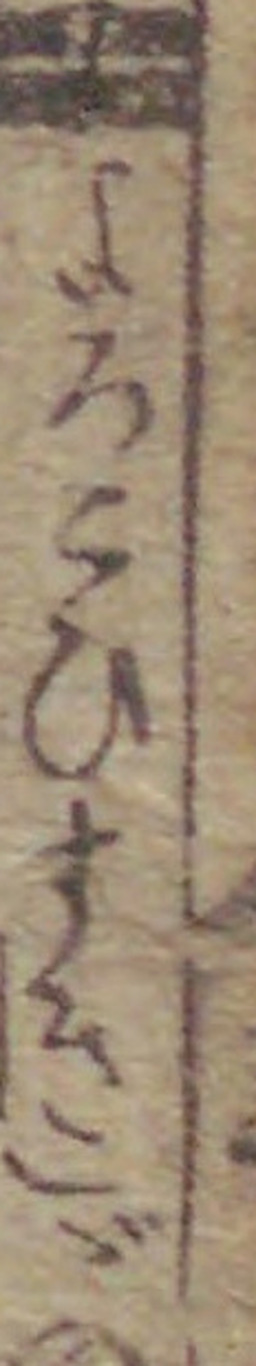よろこひすきしだい
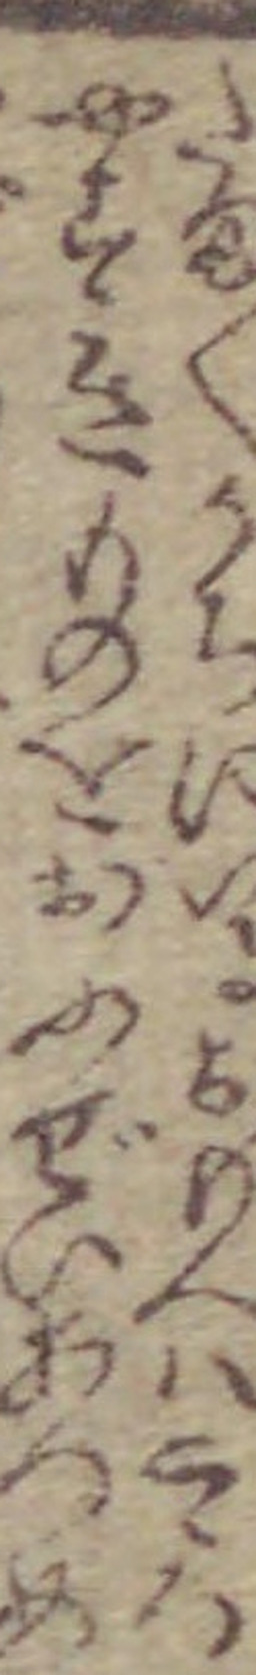やすきものをおふぜいあつめ
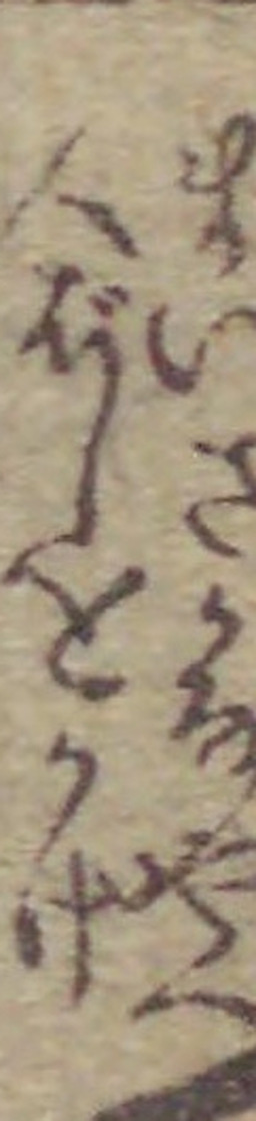人ばしをかけ
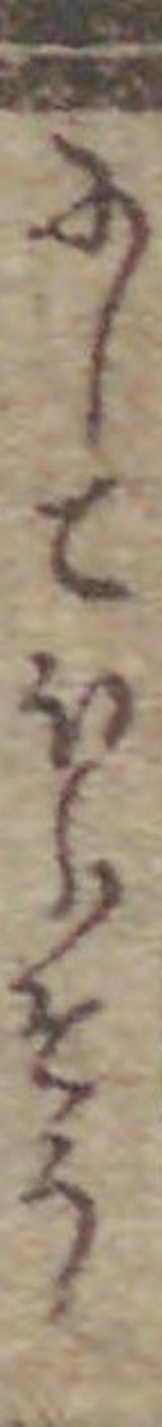にしてほふそう
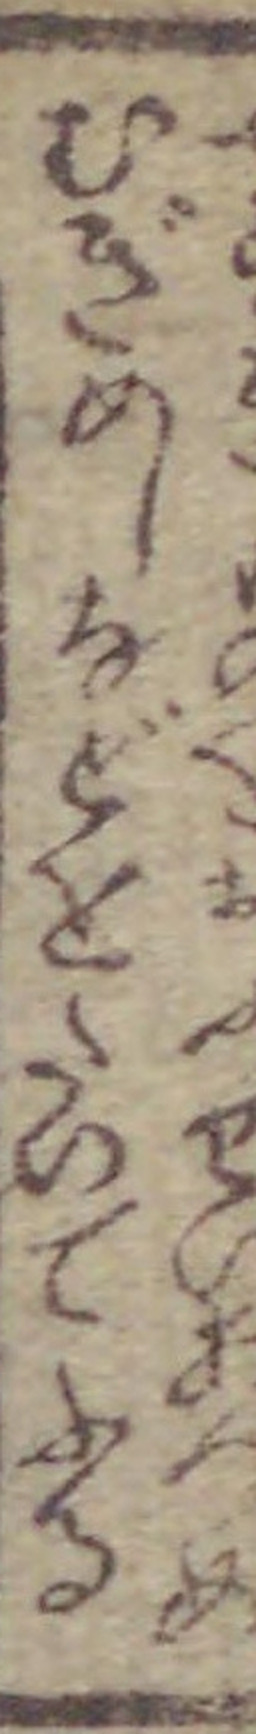むぎめしなどをたいてふる
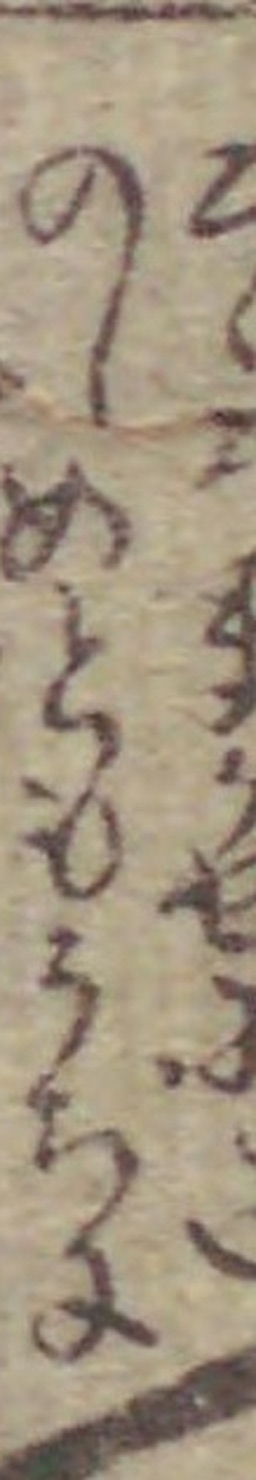のしめともうちに
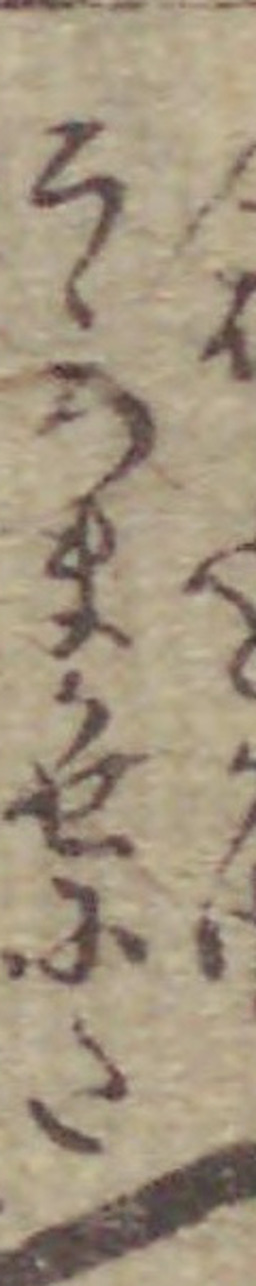こゝろまかせにた
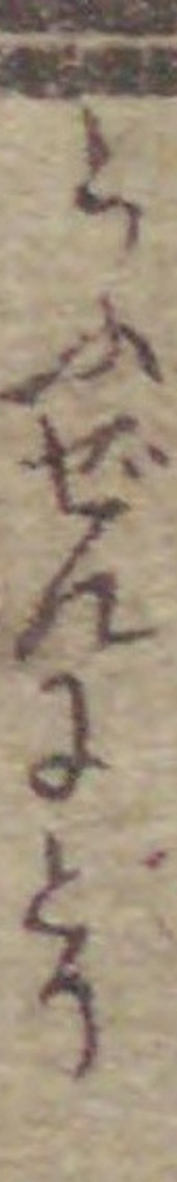とふぜんにとり
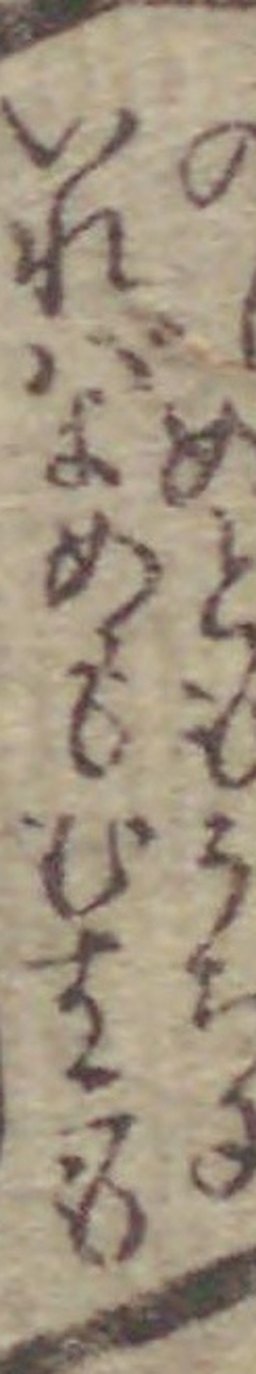いればよめもむすこも
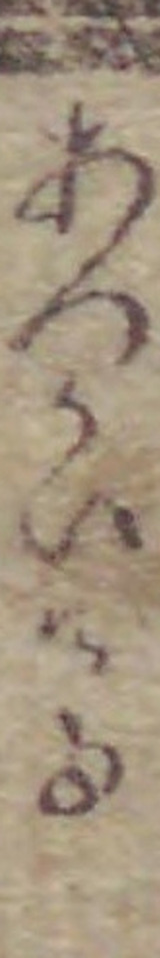あつかいける
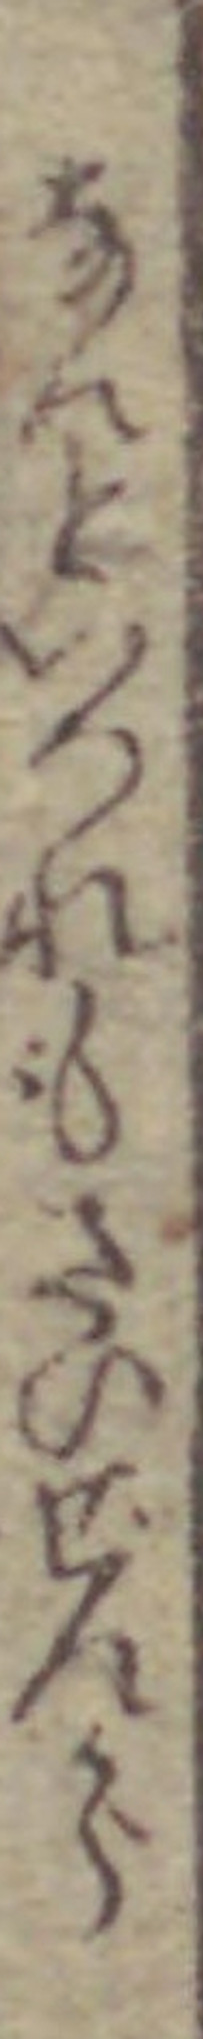なんといつれもさいぜんから
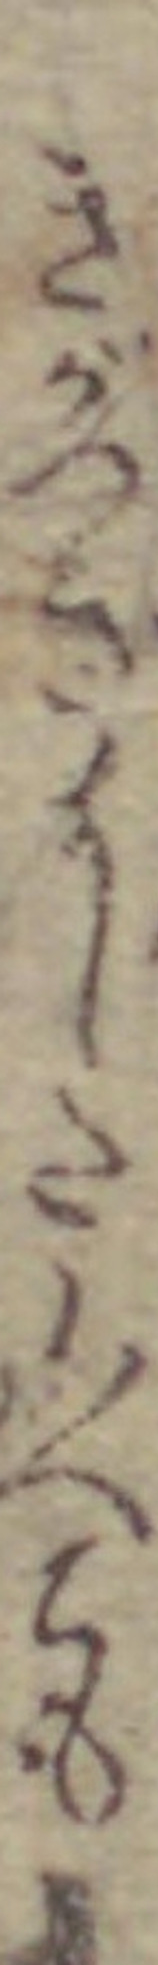きがつきました山へても
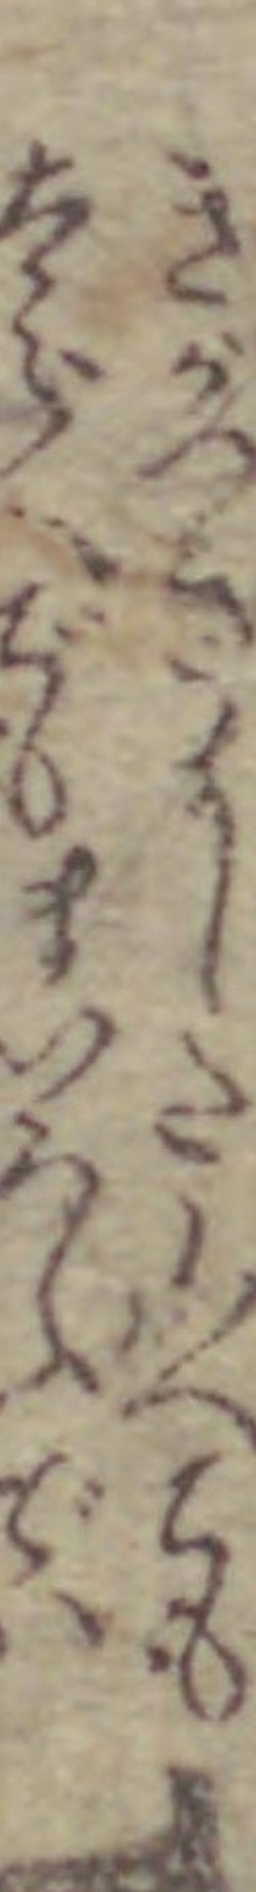太郎へでもまいろふでは
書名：親父布子鳶握 3巻
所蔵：国立国会図書館 National Diet Library, JAPAN
